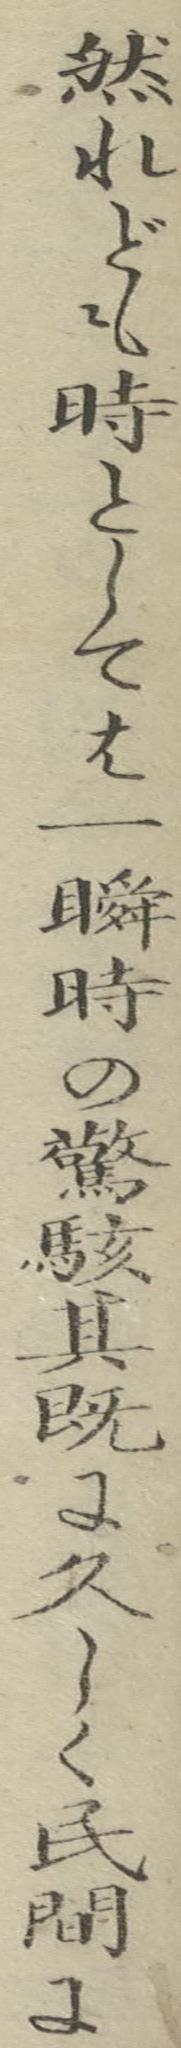然れども時としては一瞬時の驚駭其既に久しく民間に
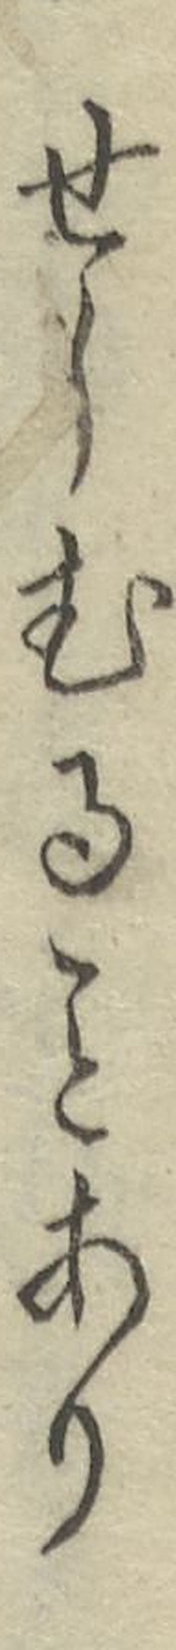せしむることあり
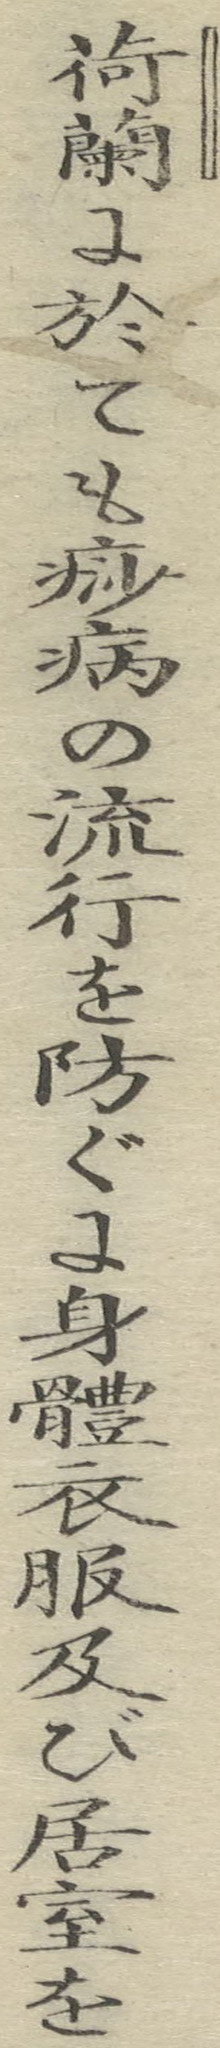荷蘭に於ても痧病の流行を防ぐに身體衣服及び居室を
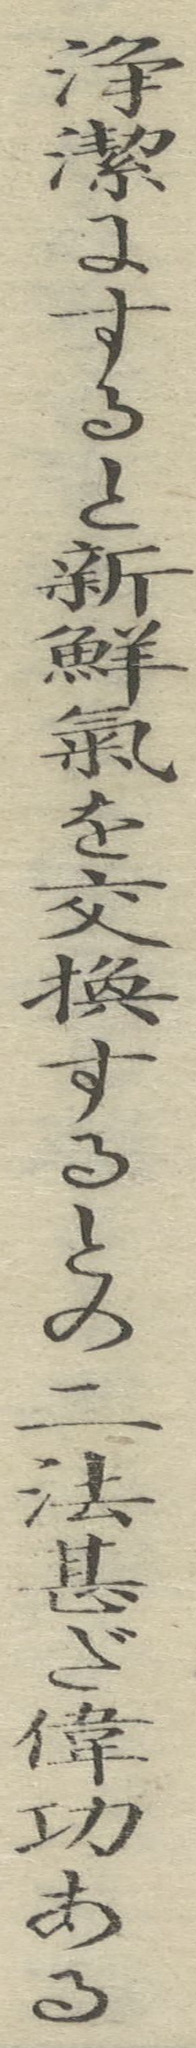浄潔にすること新鮮氣を交換することの二法甚だ偉功ある
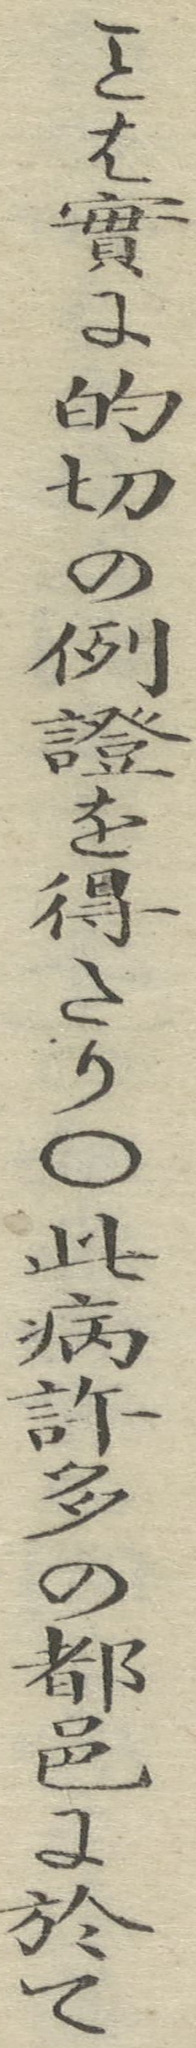ことは實に的切の例證を得たり〇此病許多の都邑に於て
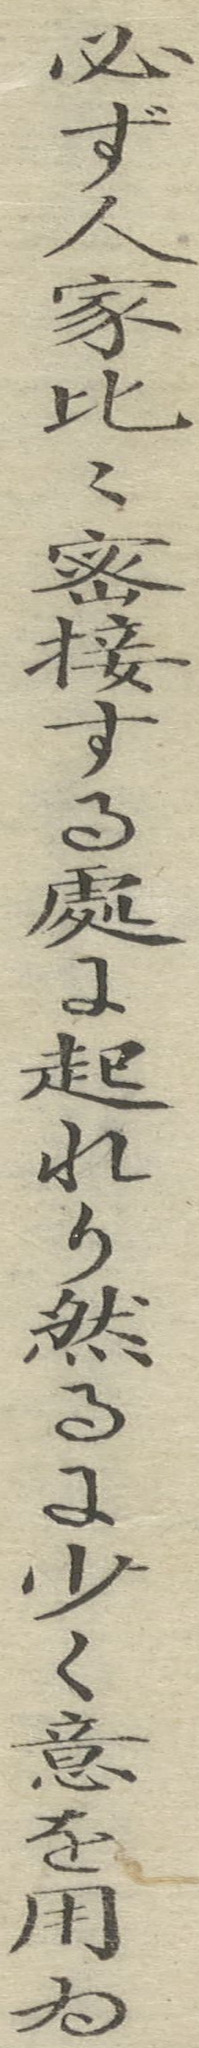必ず人家比々密接する處に起れり然るに少く意を用ゐ
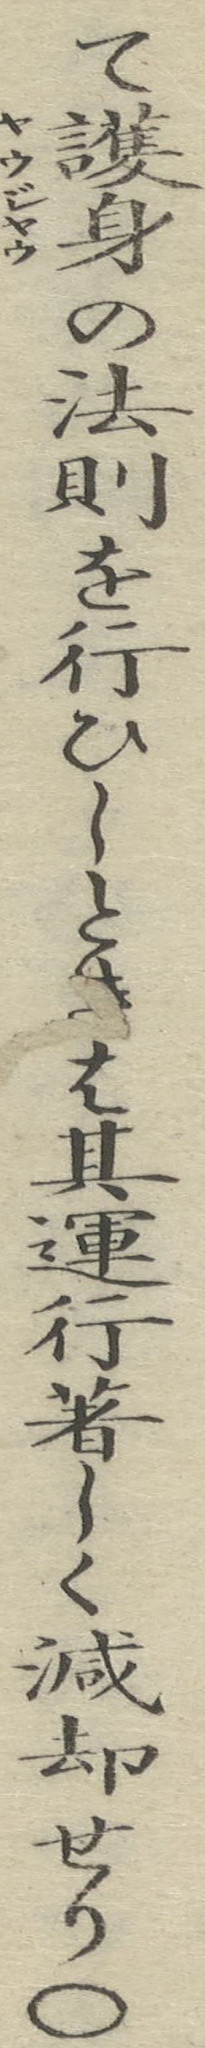て護身の法則を行ひしときは其運行著しく減却せり〇
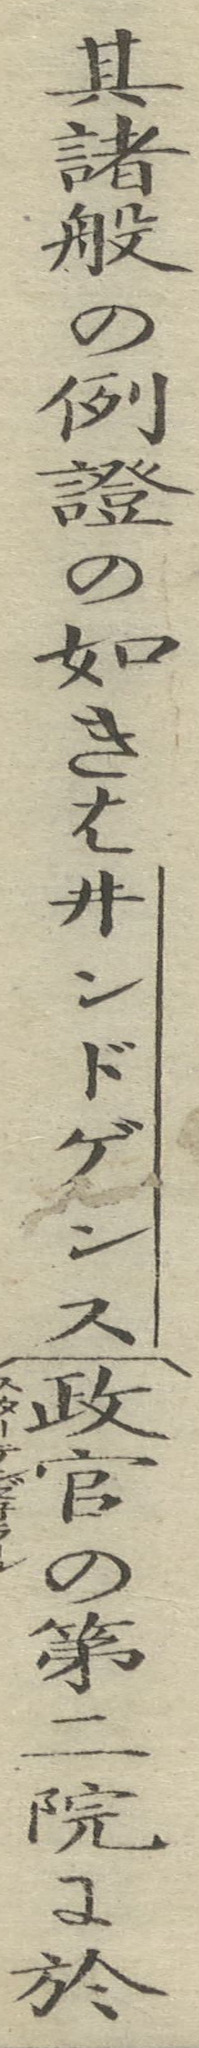其諸般の例證の如きは井ンドゲンス[政管の第二院に於
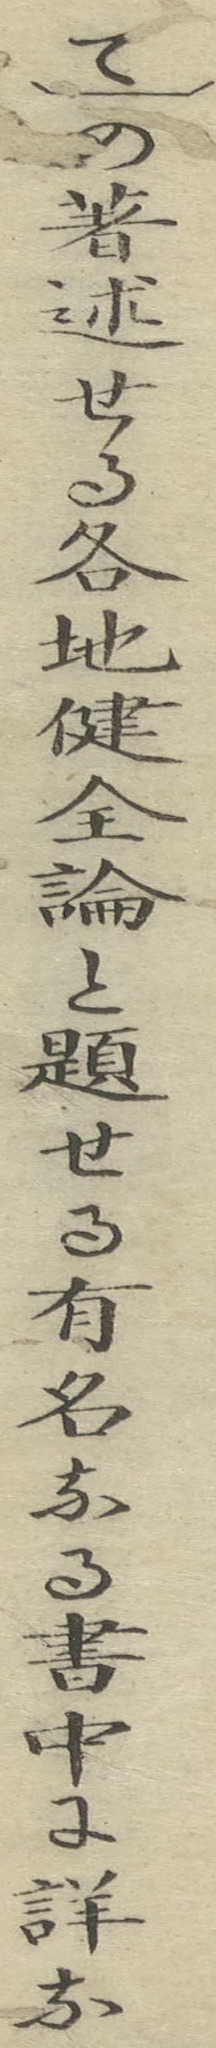て]著述せる各地健全論と題せる有名なる書中に詳な

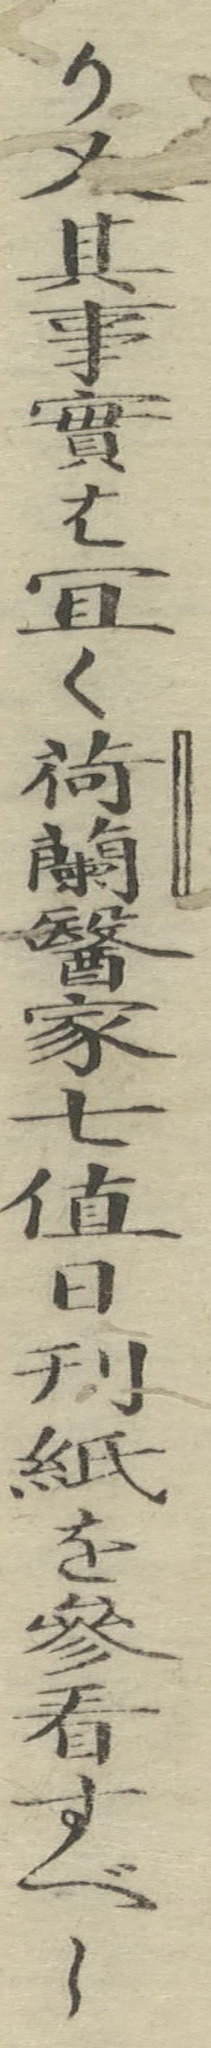り又其事實は宜く荷蘭醫家七値日刊紙を参看すべし
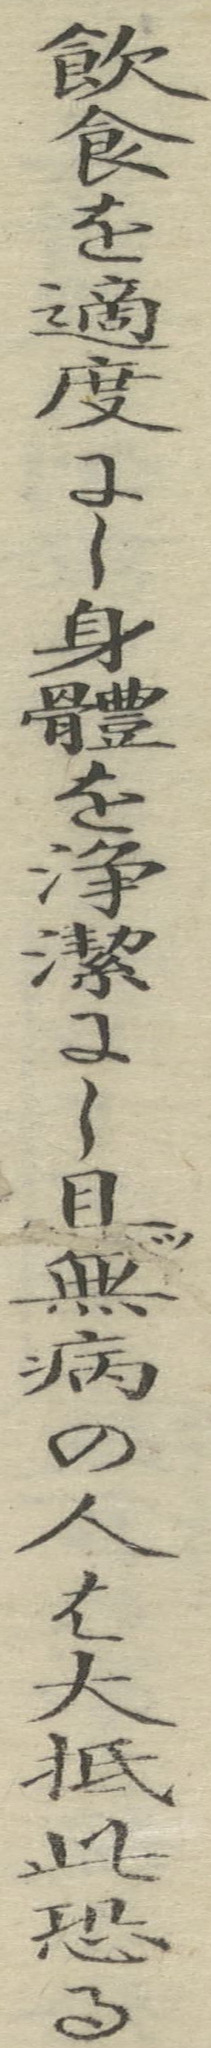飲食を適度にし身體を浄潔にし且無病の人は大抵此恐る
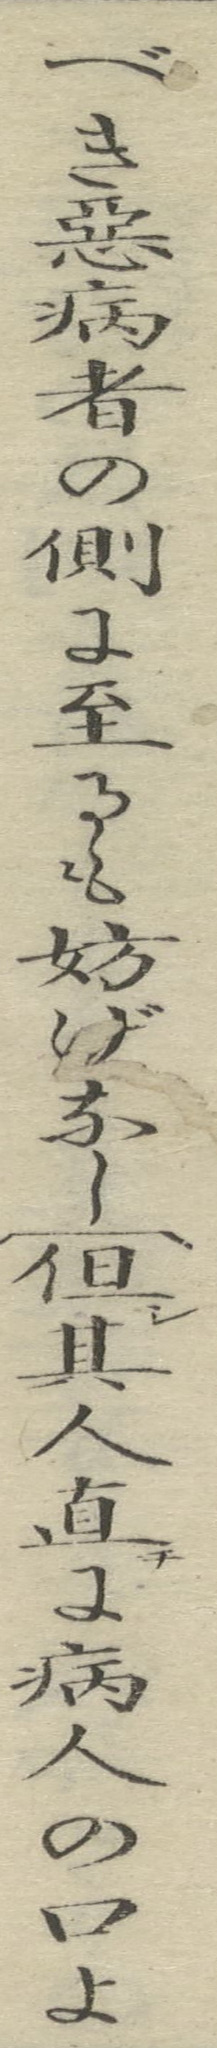べき惡病者の側に至るも妨げなし[但シ其人直病人の口よ
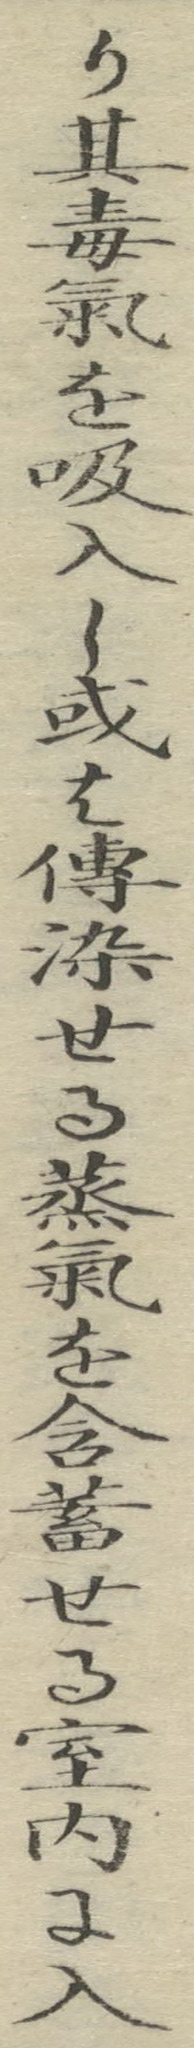り其毒氣を吸入し或は傅染せる蒸氣を含蓄せる室内に入
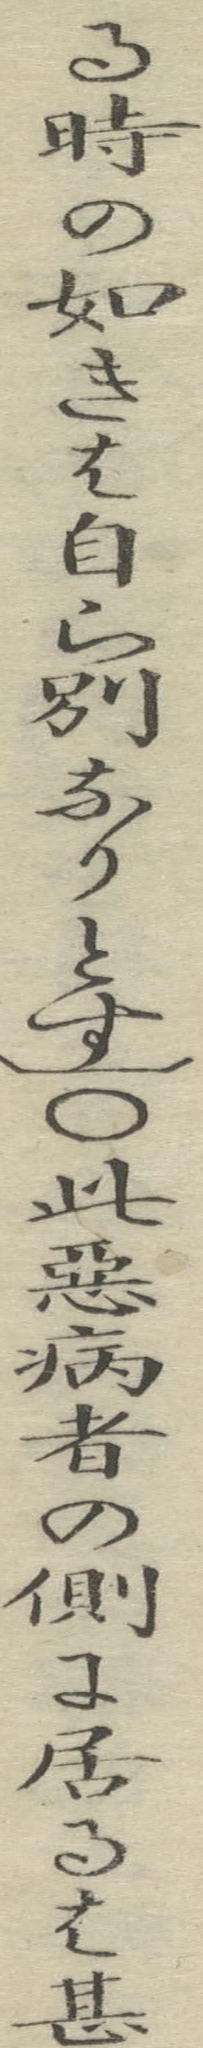る時の如きは自ら別なりとす]〇此惡病者の側に居るは甚
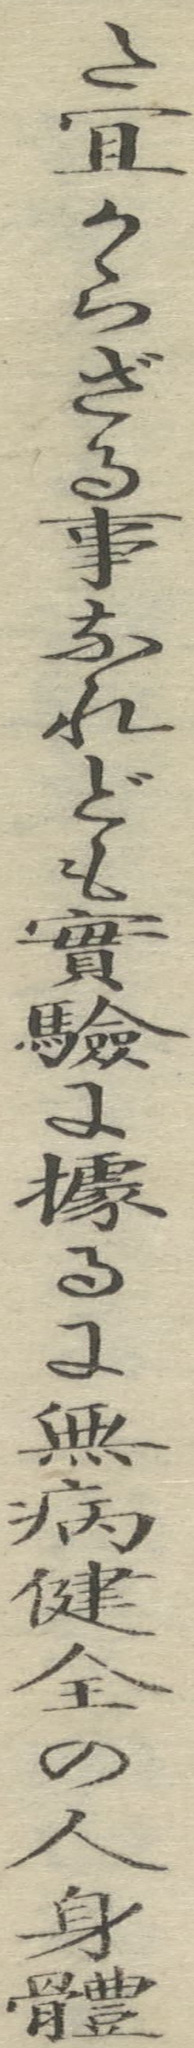た宜からざる事なれども實驗に據るに無病健全の人身體
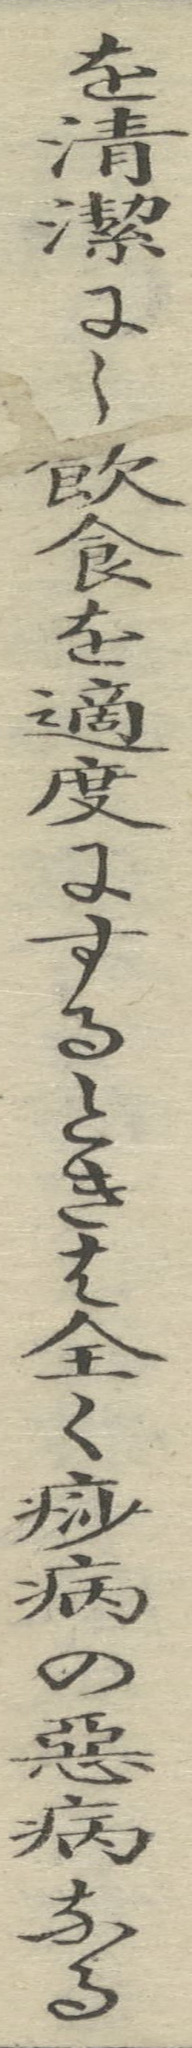を清潔にし飲食を適度にするときは全く痧病の惡病なる
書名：官版疫毒預防説　全
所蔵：東京大学総合図書館 General Library in the University of Tokyo, JAPAN
